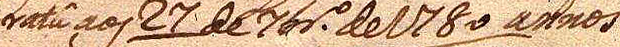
ratú aos 27 de 7br.o de 1780 annos
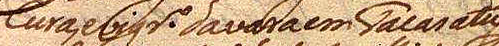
Cura e vigr.o da vara em Tacaratú
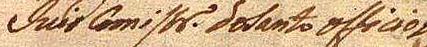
Iuis Comissr.o do Santo officio
